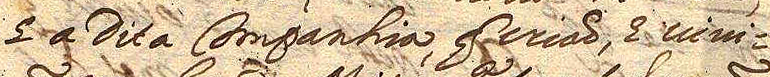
E a dita Companhia, q̄ criaõ, E uiui
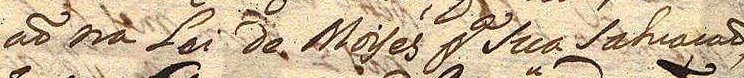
aõ na lei de Moises pa sua saluaçaõ
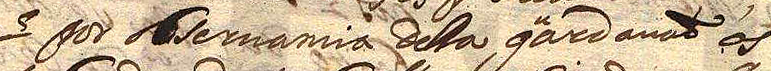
E por obseruancia della guardauão os
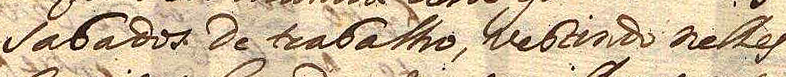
sabados de trabalho, uestindo nelles
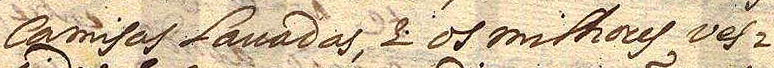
camisas lauadas, E os milhores ves
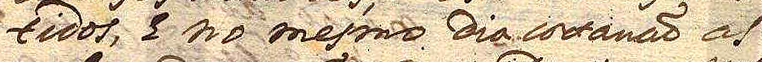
tidos, E no mesmo dia cortauaõ as
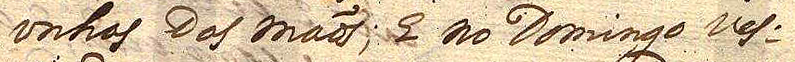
vnhas das mãos; E no Domingo ues
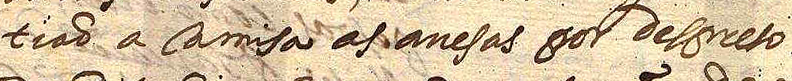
tiaõ a camisa as auesas por despreso
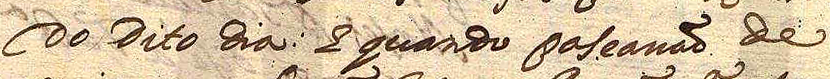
do dito dia: E quando paseauão de
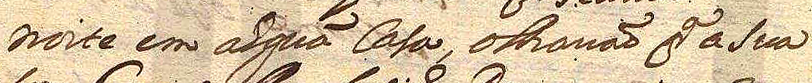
noite em alguā Casa, olhauão pa a sua
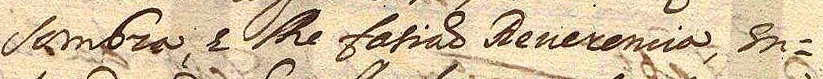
sombra, E lhe fasiaõ Reuerencia, En
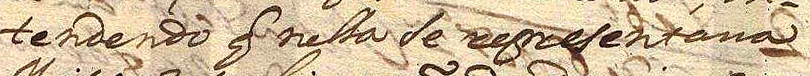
tendendo q̄ nella se representaua
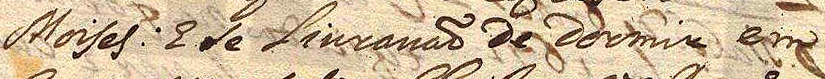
Moises. E se liurauão de dormir em
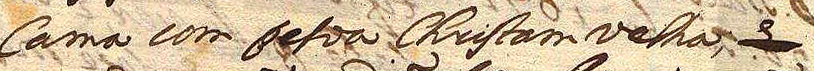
Cama com pesoa Christam velha, E
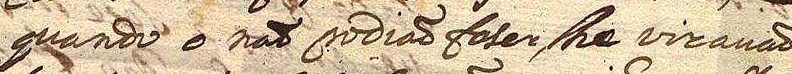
quando o naõ podiaõ fazer lhe virauão
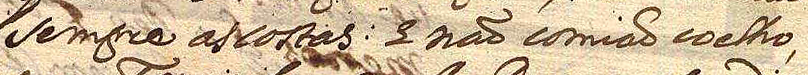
sempre as costas: E naõ comião coelho,
